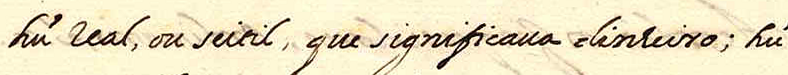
hū real, ou seitil, que significaua dinheiro; hū
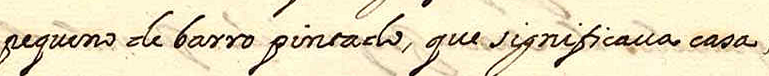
pequeno de barro pintado, que significaua casa;
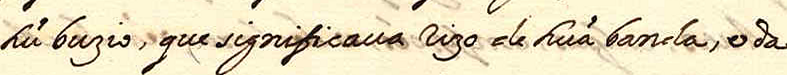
hū buzio, que significaua rizo de huā banda, e da
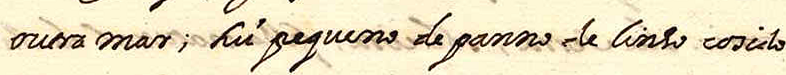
outra mar; hū pequeno de panno de linho cosido
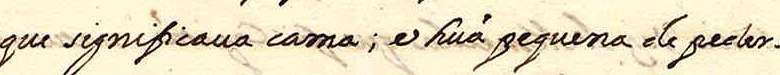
que significaua cama; e huā pequena de peder
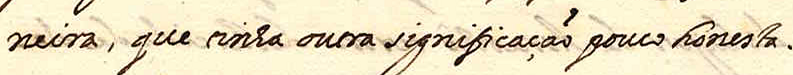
neira, que tinha outra significaçaõ pouco honesta.
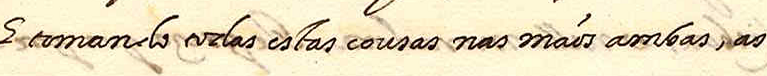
E tomando todas estas cousas nas mãos ambas, as
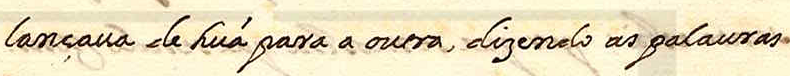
lançaua de huā para a outra, dizendo as palauras
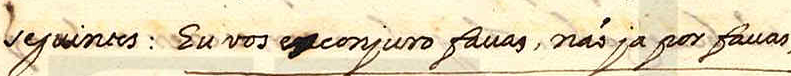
seguintes: Eu vos esconjuro fauas, naõ já por fauas,
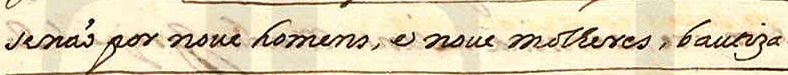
se não por noue homens, e noue molheres, bautiza
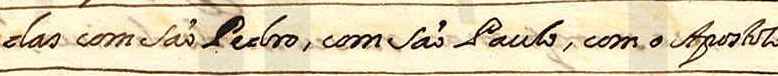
das com Saõ Pedro, com Saõ Paulo, com o Apostolo
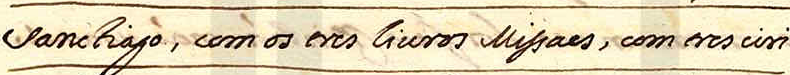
Sanctiago, com os tres liuros Missaes, com tres ciri
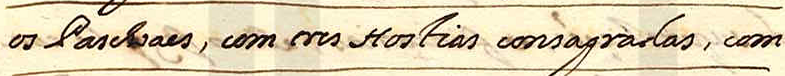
os Paschoaes, com tres Hostias consagradas, com
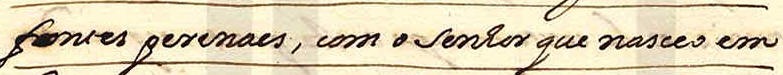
fontes perenaes, com o Senhor que nasceo em
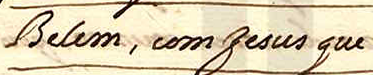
Belem, com Jesus que
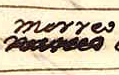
morreo
